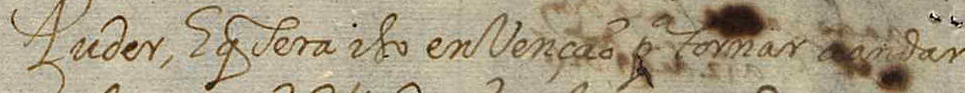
Puder, E q̄ Sera iso enVençaõ pa tornar a andar
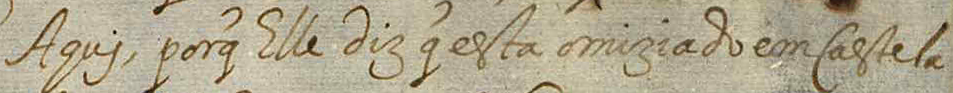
Aquj, porq̄ Elle diz q̄ esta omiziado em Castela
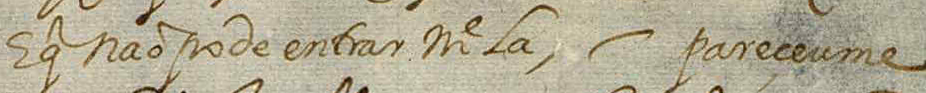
E q̄ naõ pode entrar me La, – pareceume
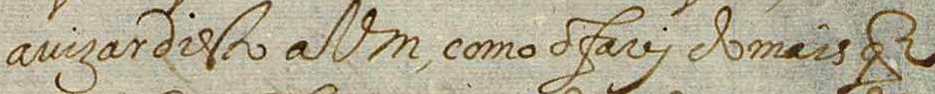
auizar disto a V m, como o farej do mais q̄
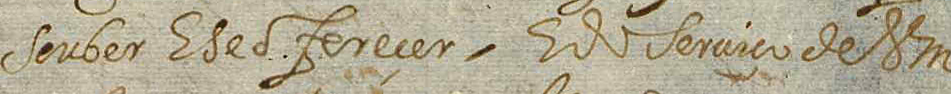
Souber E se oferecer, E do Seruiço de Vm
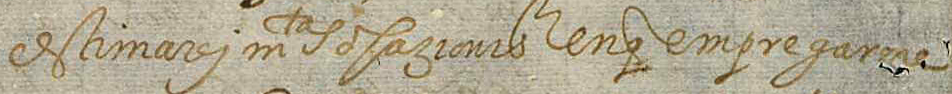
estimarej mtas oCazionis en q̄ empregarme
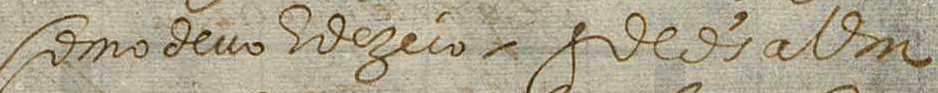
Como deuo E dezeio – gde ds̄ a Vm
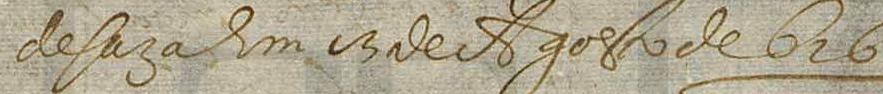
de Caza Em 13 de Agosto de 616
